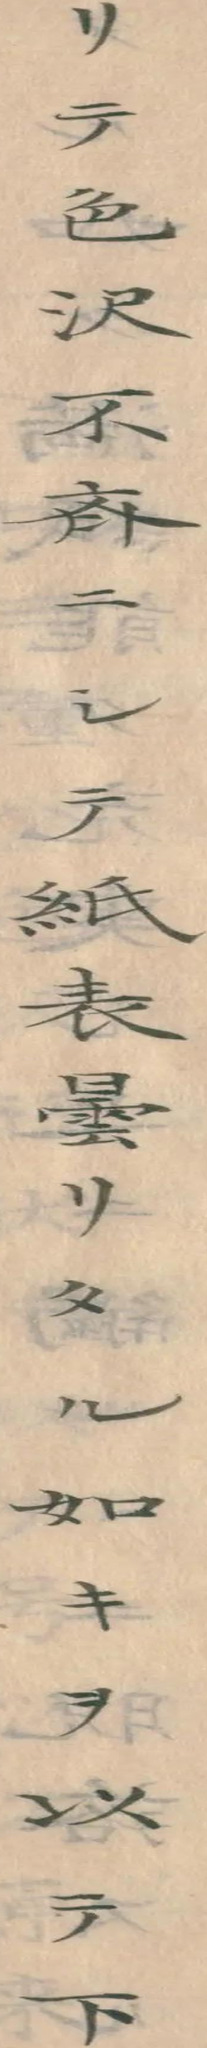リテ色沢不斉ニシテ紙表曇リタル如キヲ以テ下
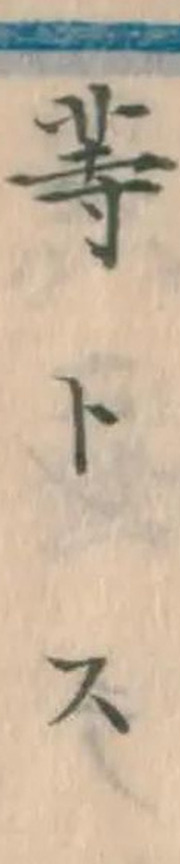等トス
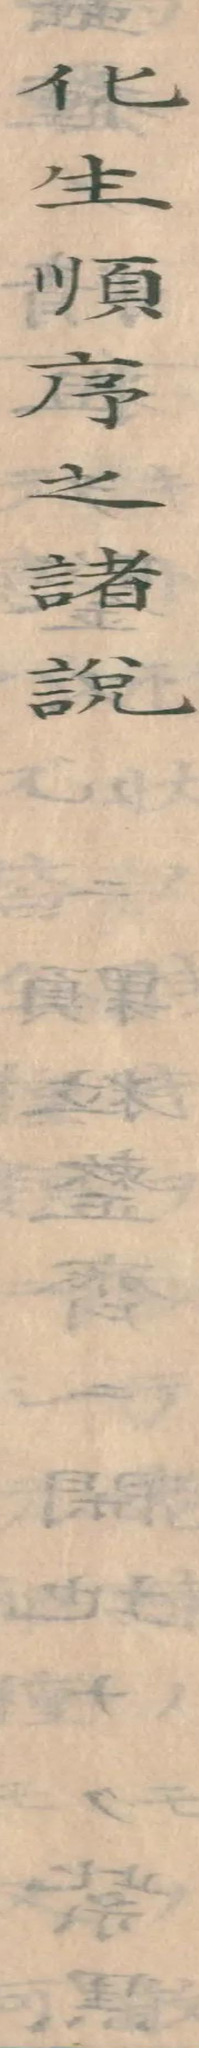化生順序之諸説
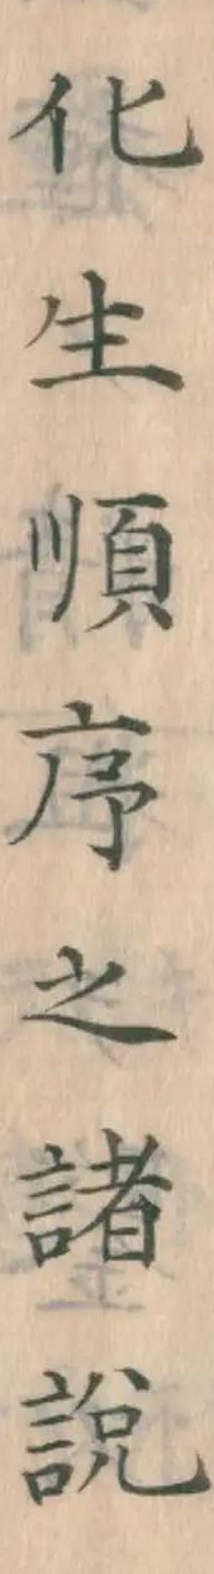化生順序之諸説
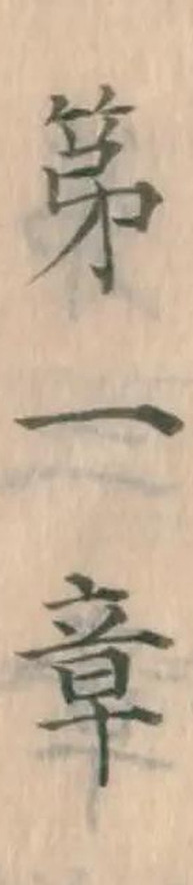第一章
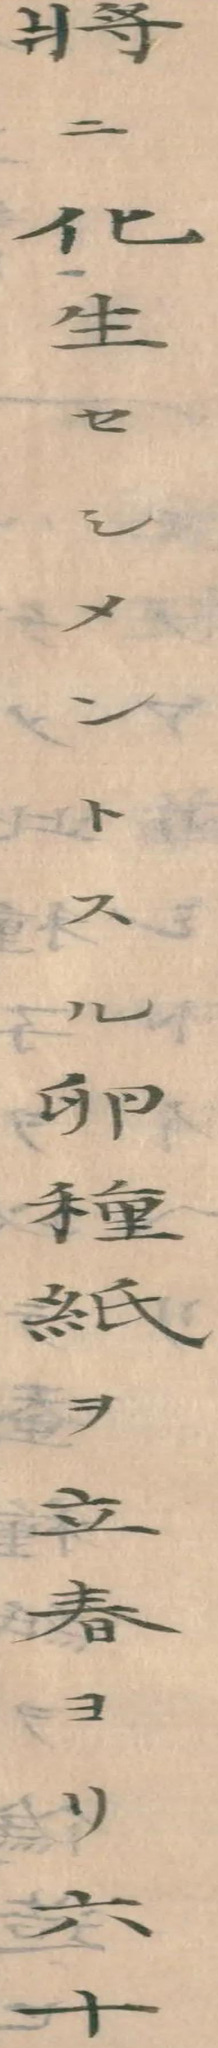将ニ化生セシメントスル卵種紙ヲ立春ヨリ六十
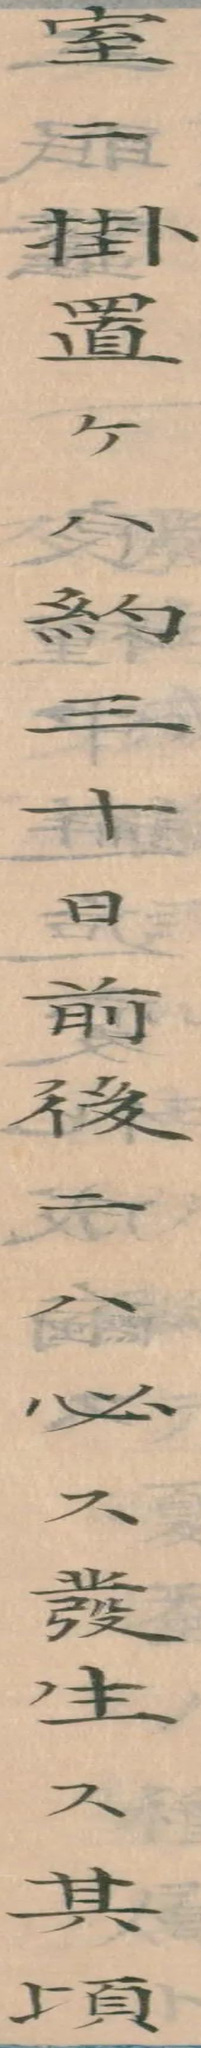室ニ掛置ケハ約三十日前後ニハ必ス発生ス其頃
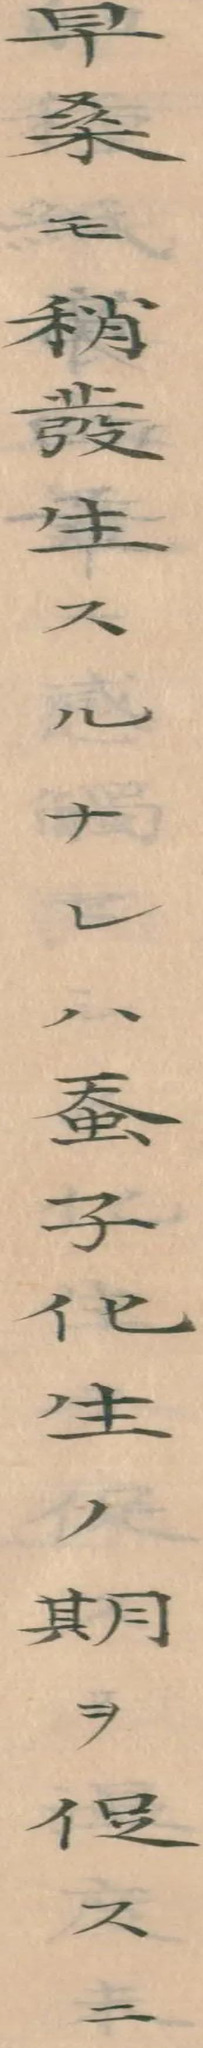早桑モ稍発生スルナレハ蚕子化生ノ期ヲ促スニ
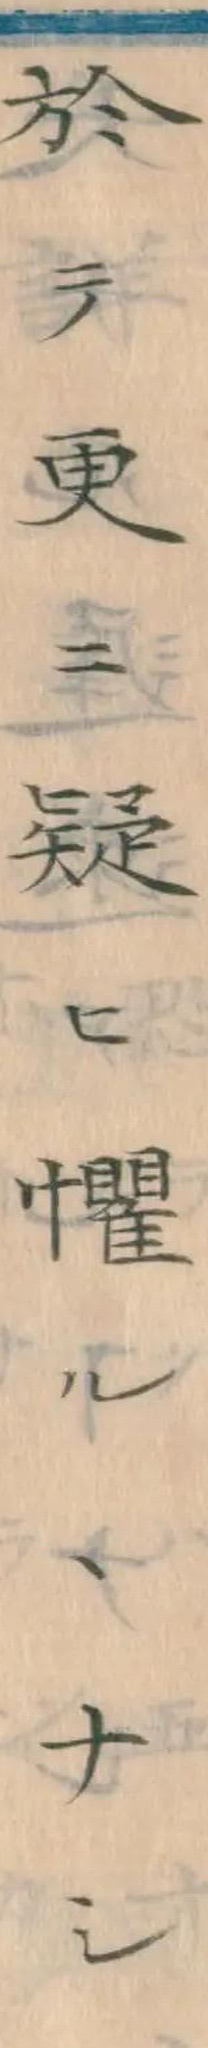於テ更ニ疑ヒ懼ルヽナシ
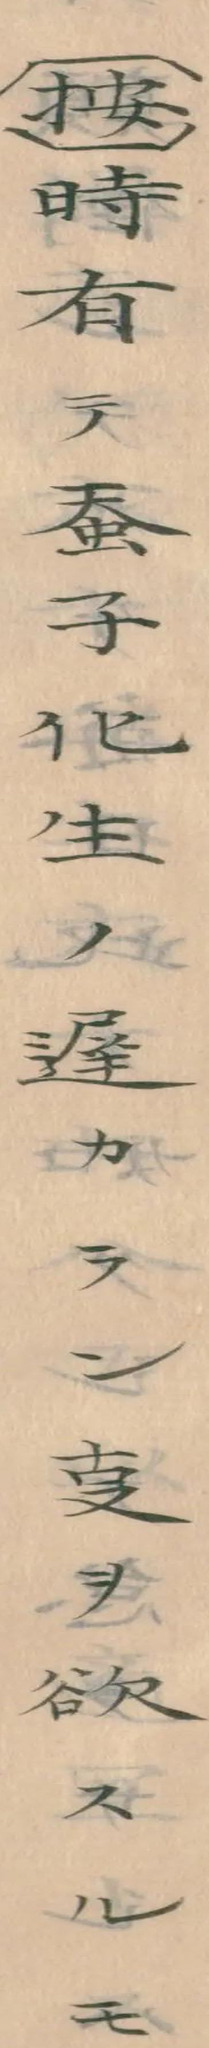[按]時有テ蚕子化生ノ遅カラン事ヲ欲スルモ
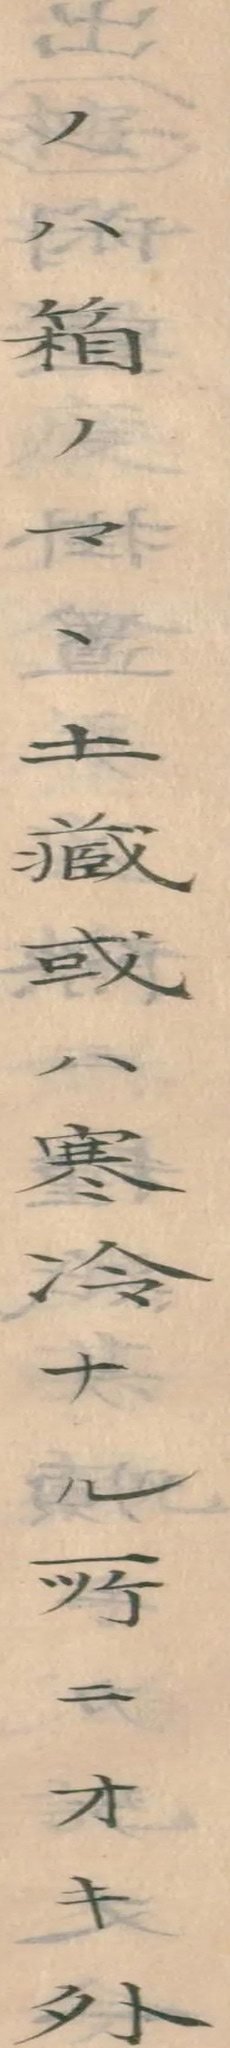ノハ箱ノマヽ土蔵或ハ寒冷ナル所ニオキ外
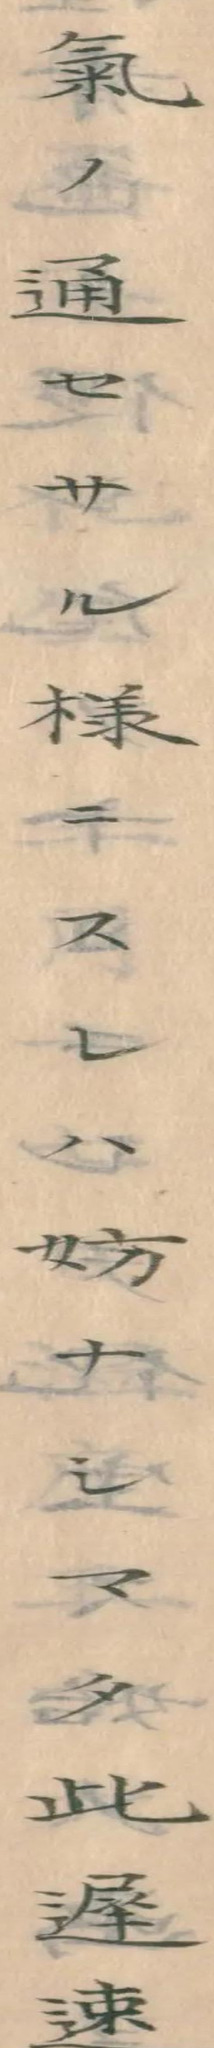気ノ通セサル様ニスレハ妨ナシマタ此遅速
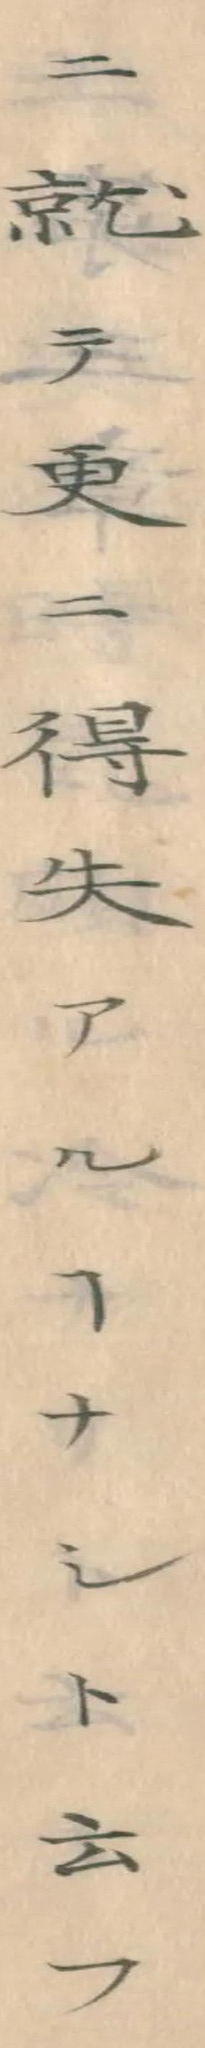ニ就テ更ニ得失アルコトナシト云フ
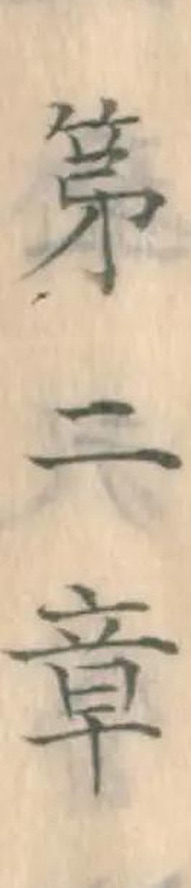第二章
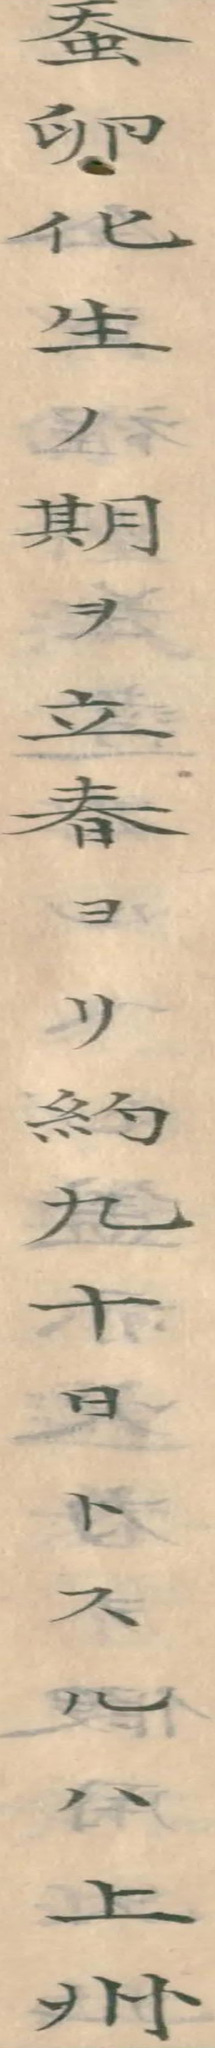蚕卵化生ノ期ヲ立春ヨリ約九十日トスルハ上州
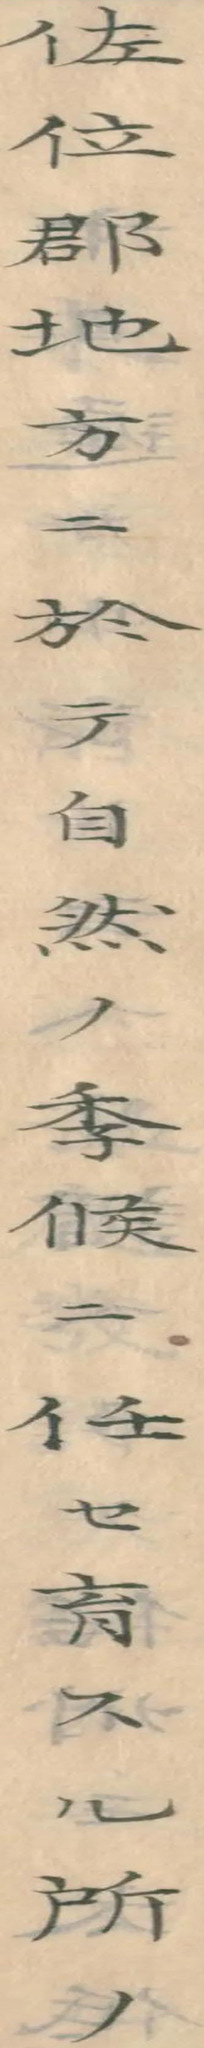佐位郡地方ニ於テ自然ノ季候ニ任セ育スル所ノ
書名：蚕桑集成
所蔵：国立国会図書館 National Diet Library, JAPAN
